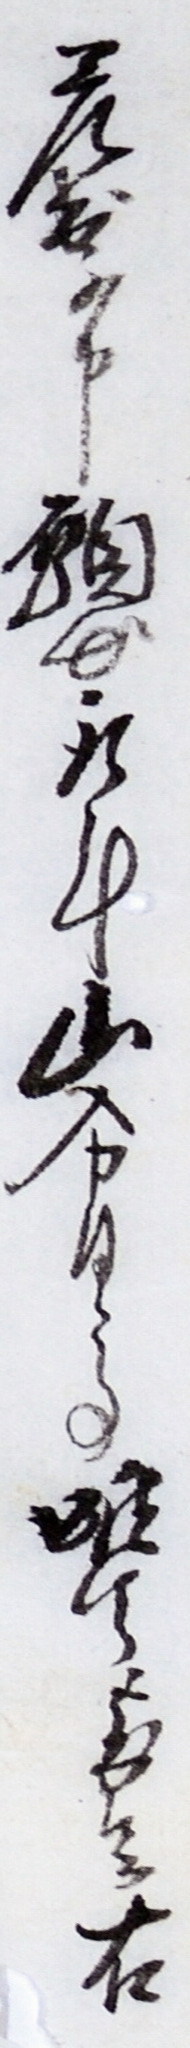差出不申願出取斗山入申付候事昨今ニ至候而右
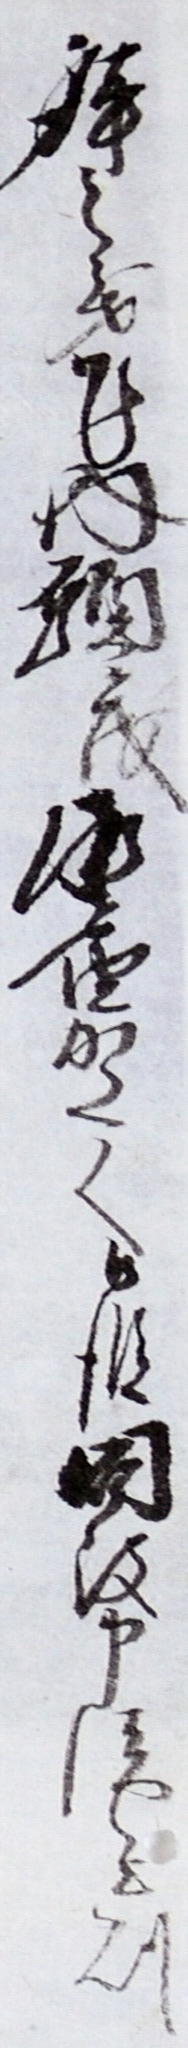躰之義乍内願ニも承届かたく候段同役申談之上則
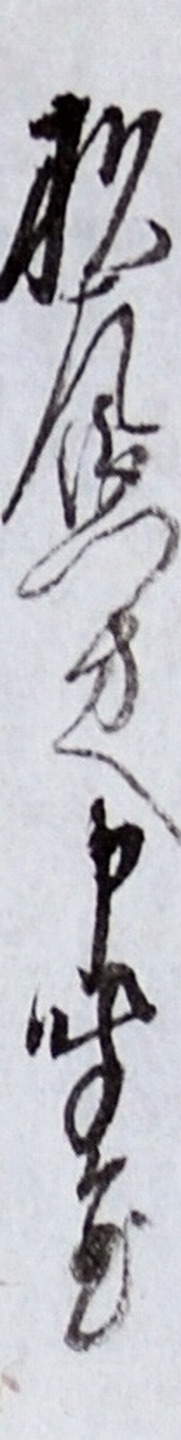杉左衛門方へ申聞置
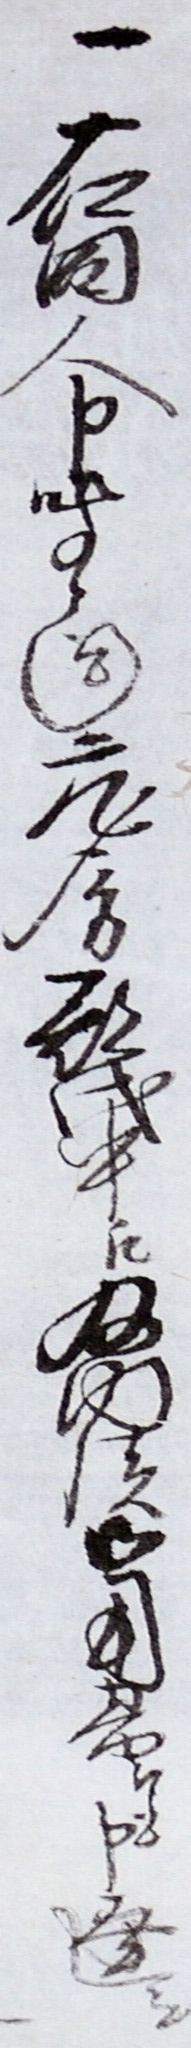一右同人申聞候趣元〆方郡代中江及内談御用番江も申達シ
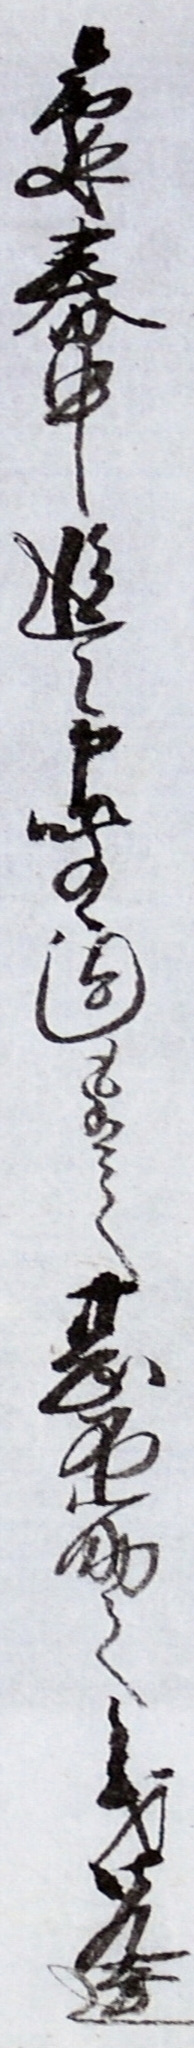候処春中追々申聞候趣も有之甚不筋之義先達
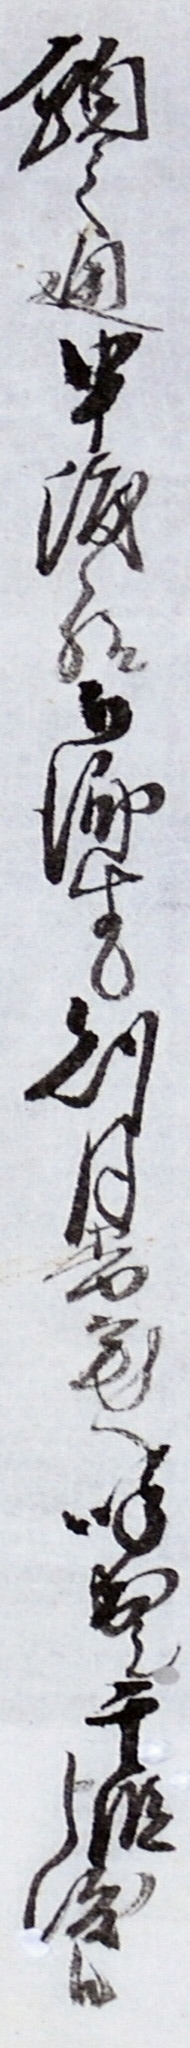願之通申渡候様被仰聞候則月番宅へ呼出シ其段申渡候
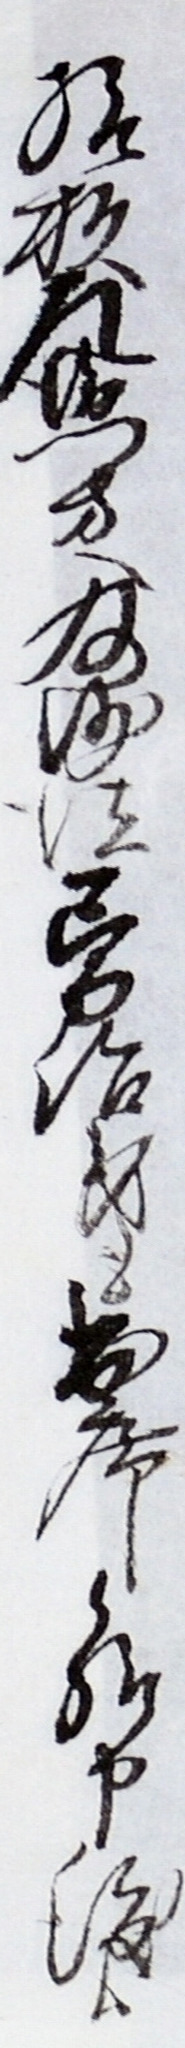様杉左衛門方へ及沙汰勇治義も出席候様申渡候
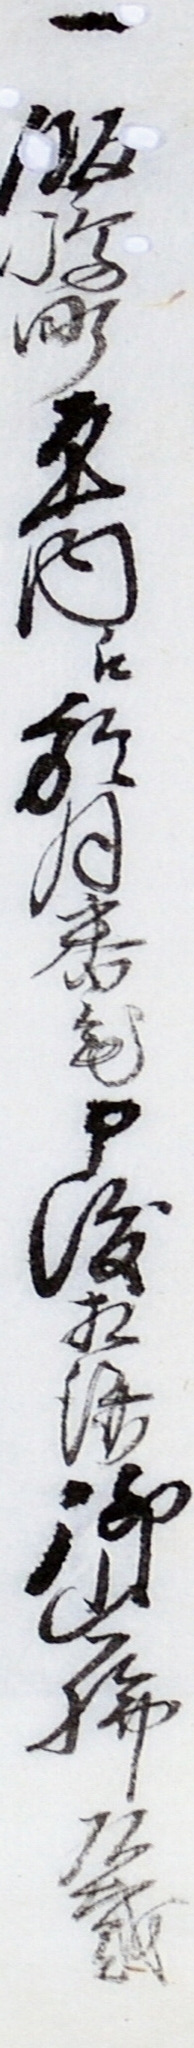一飯嶋町平内江於月番宅申渡相済御山御払頂戴
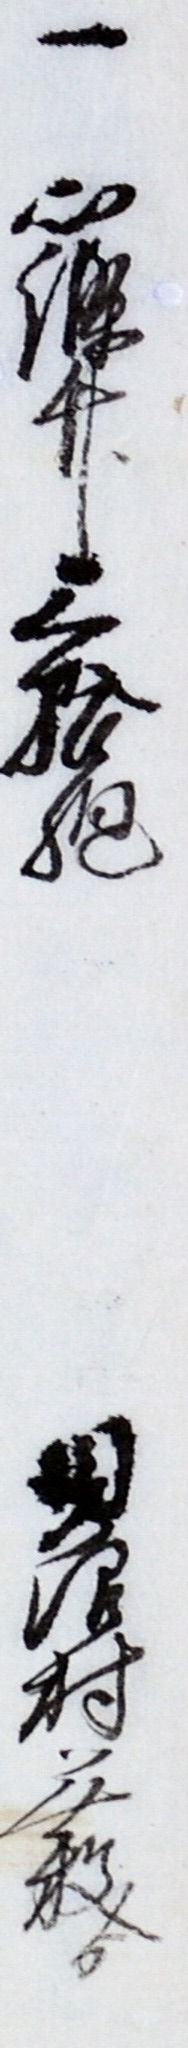一篠竹三拾把貝沼村薮より
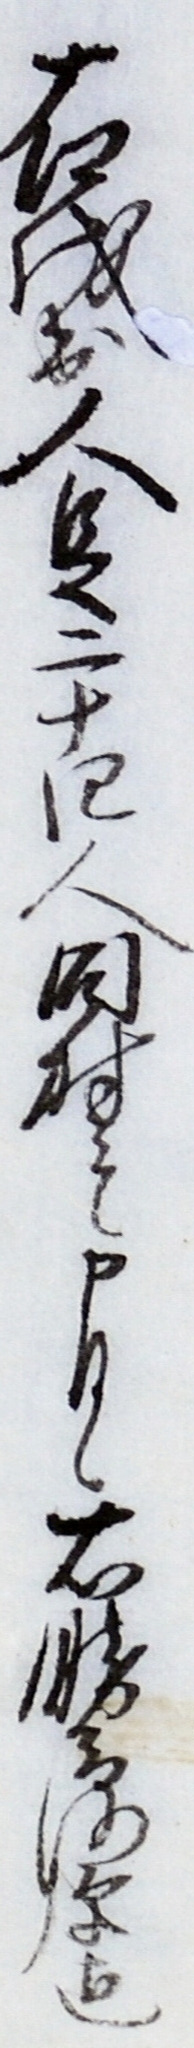右伐出人足二十四人同村ニて申付候右勝間河原迄
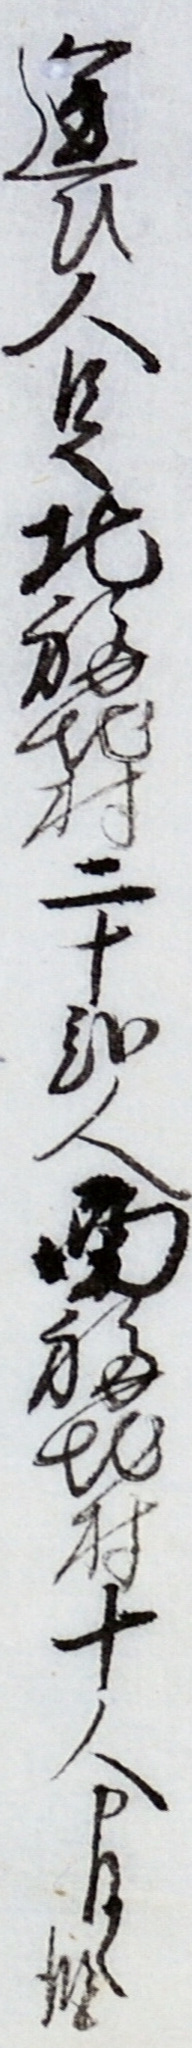運ひ人足北福地村二十弐人南福地村十人申付候段
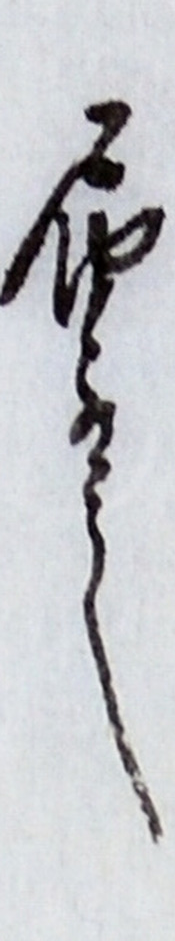届有之
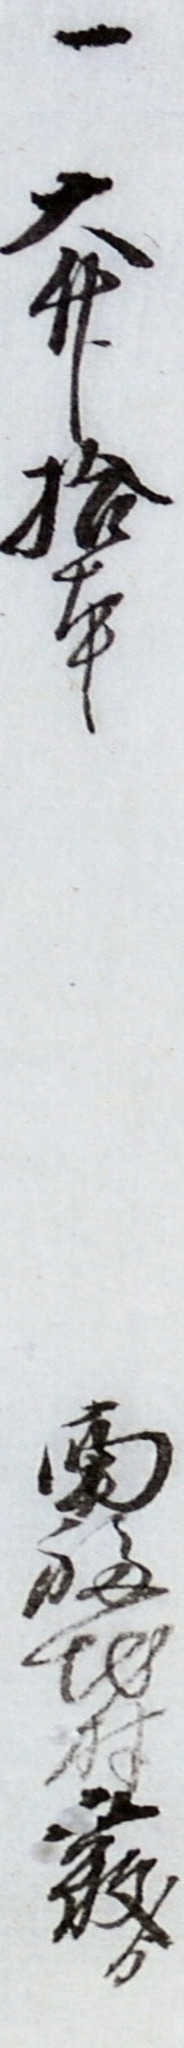一大竹拾本南福地村薮より
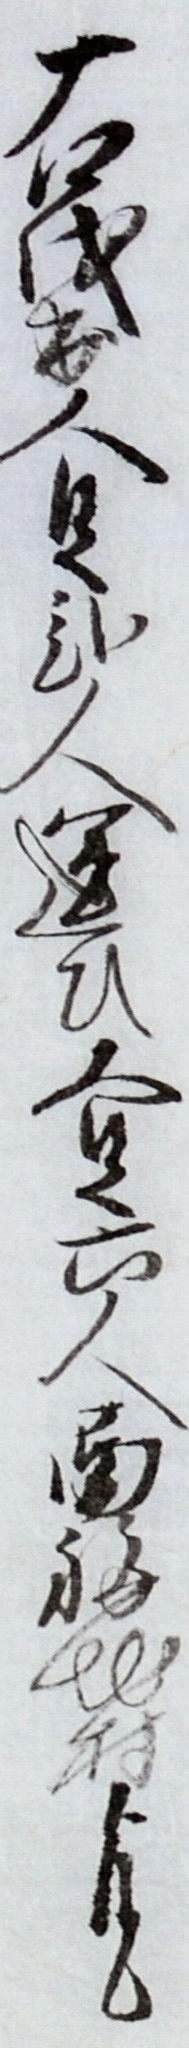右伐出人足弐人運ひ人足六人南福地村申付候
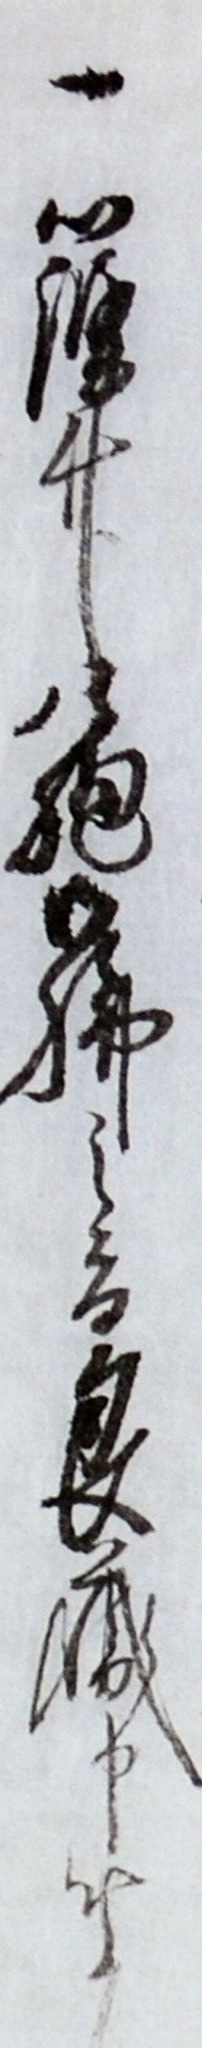一篠竹八把御払之旨良蔵申聞候
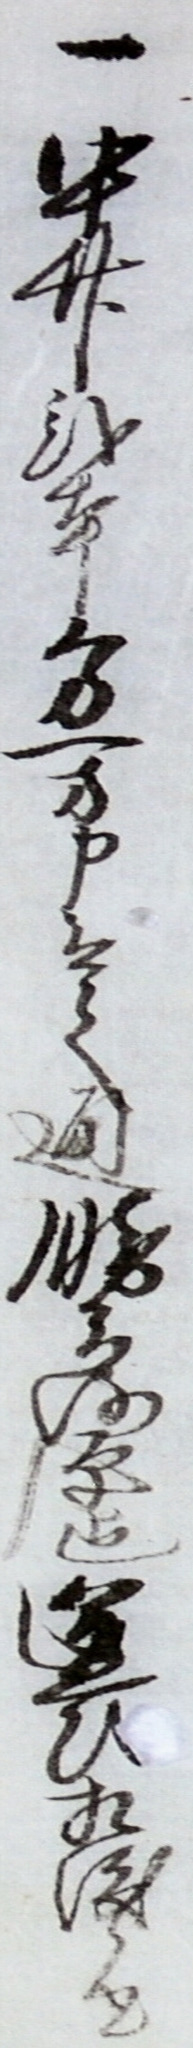一中竹弐本分一方申立之通勝間河原迄運ひ相渡候由
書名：御山奉行御用控
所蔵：伊那市立高遠町図書館・合同会社AMANE
